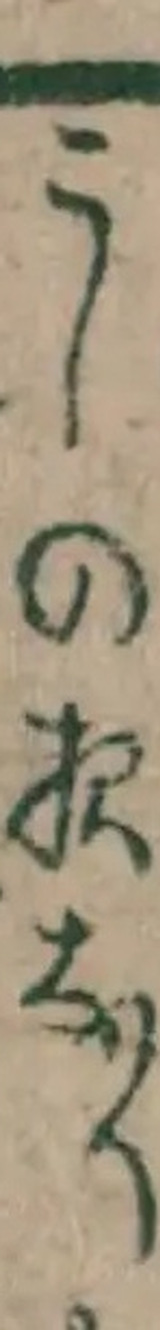こしの夜なり
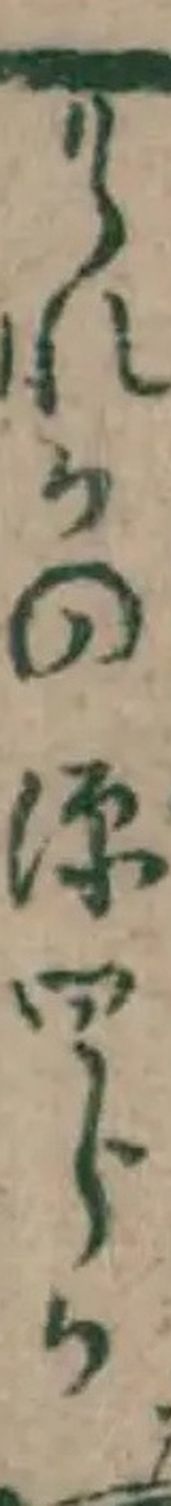けれかの源四郎か
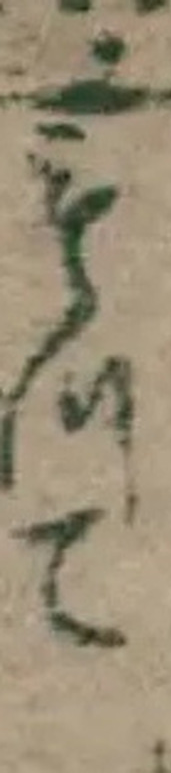もつて
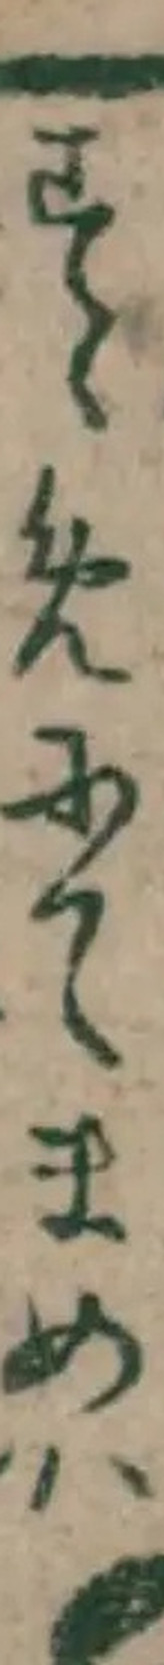すゝめにてまめは
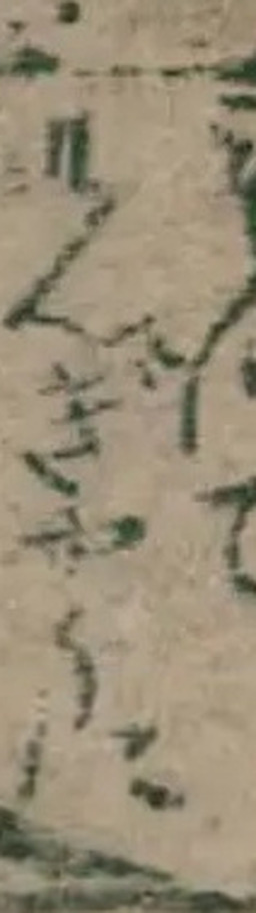けんぎやうに
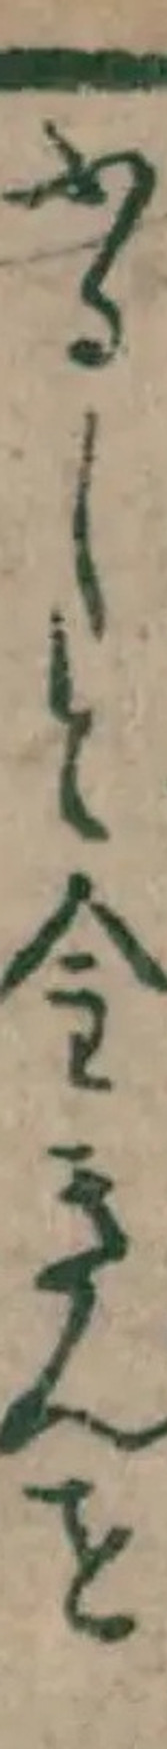ふるしと金きんを
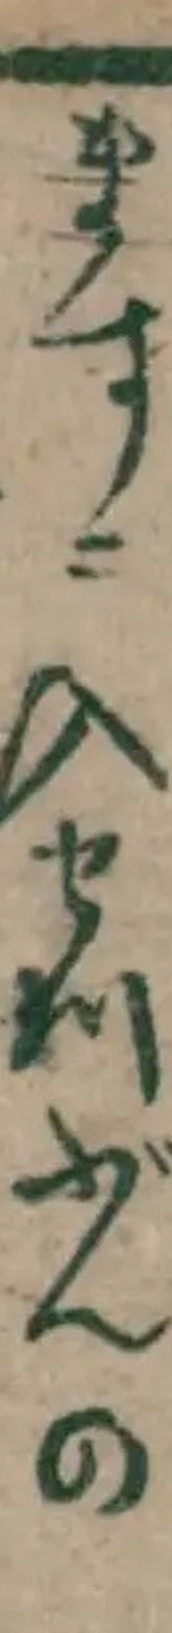ますに入せつぶんの
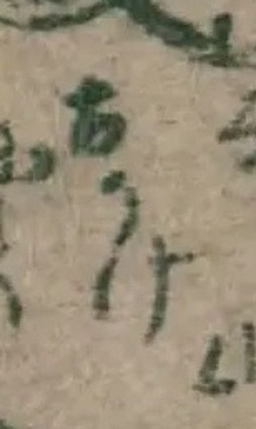出かけ
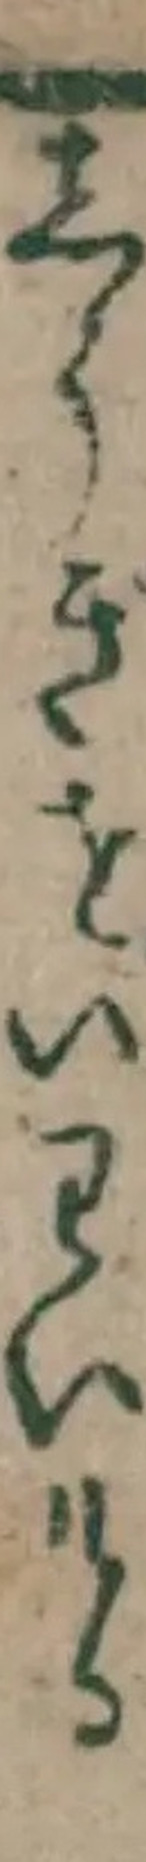しうぎをいわいける
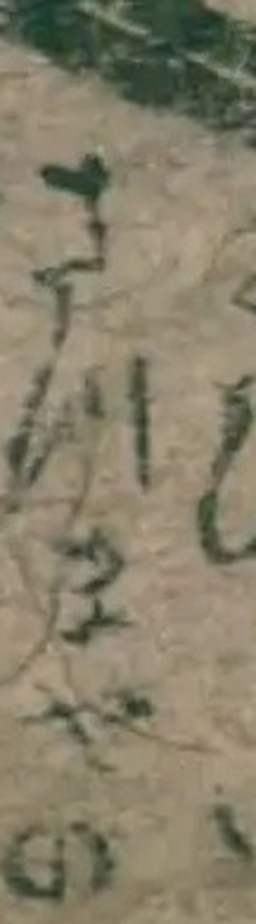さつまやの
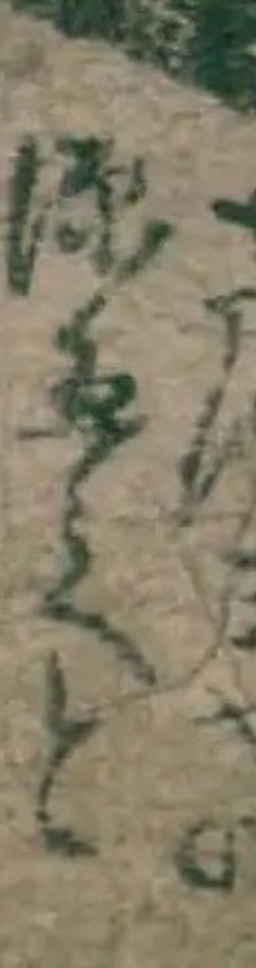源五兵衛と
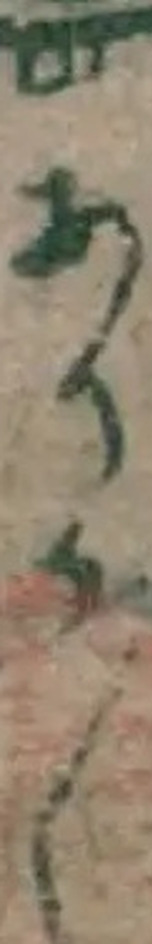ありか〳〵

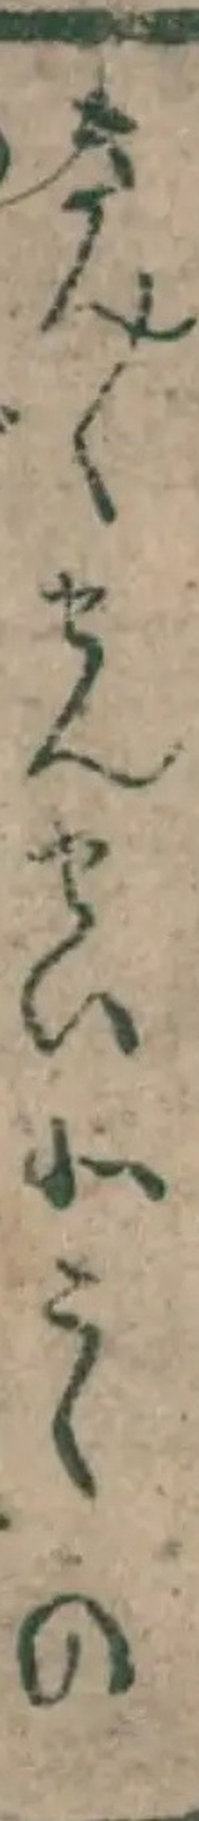きん〳〵せんせい北こくの
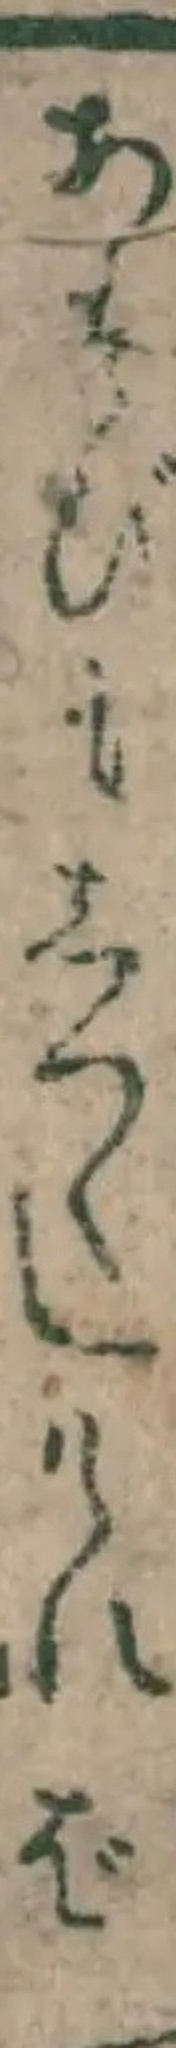あそびもしつくしければ
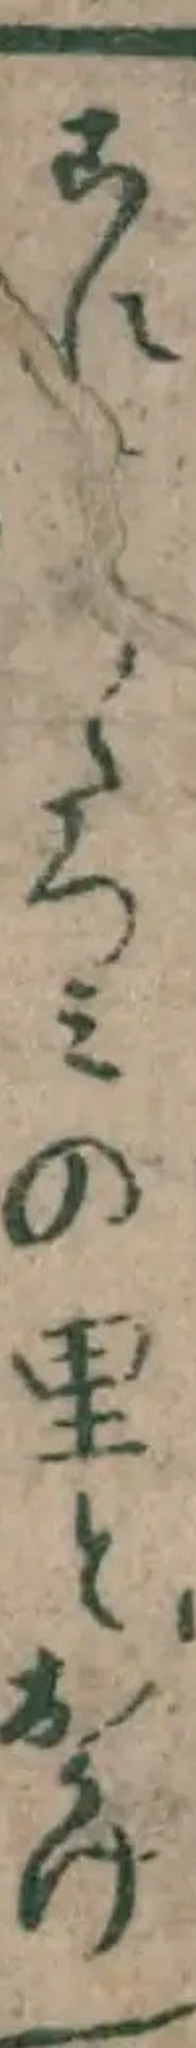これよりたつみの里と出かけ
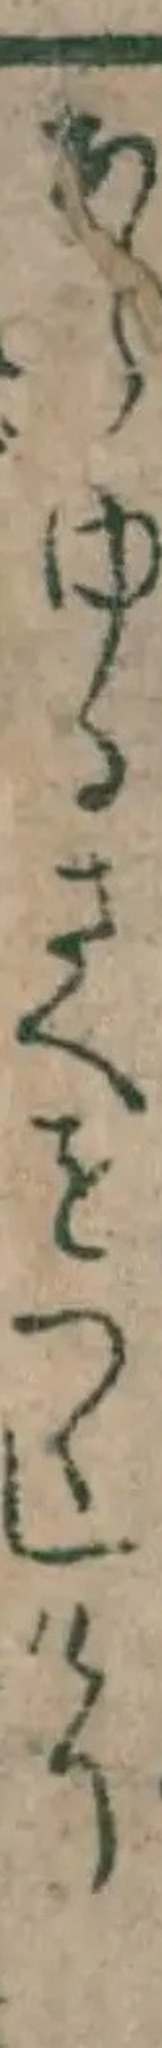あらゆるさへをつくしけり
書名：金々先生栄花夢 : 2巻
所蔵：国立国会図書館 National Diet Library, JAPAN
